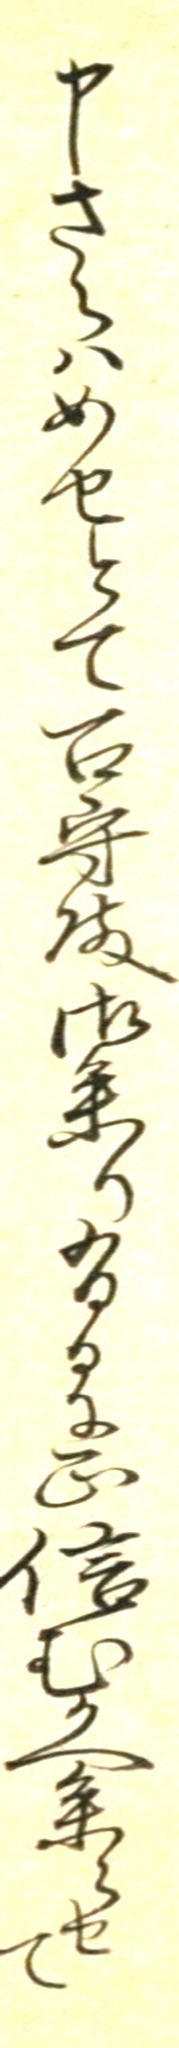申さらはめせとて召守殿御参り有るに正信むかへ参らせて
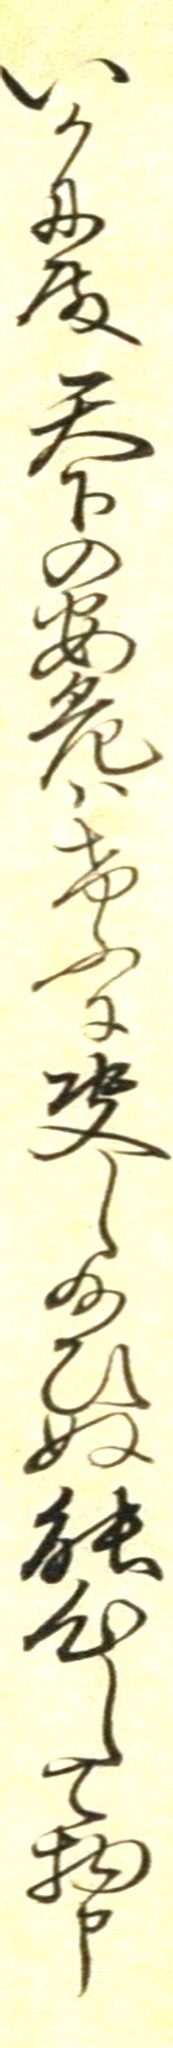いかに殿天下の安危はけふに決し給ひぬ能心して物申
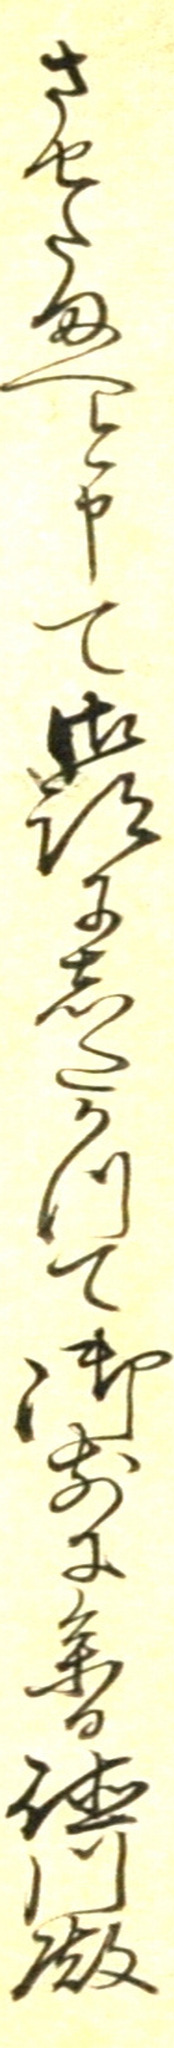させたまへと申て御跡にしたかつて御前に参る徳川殿
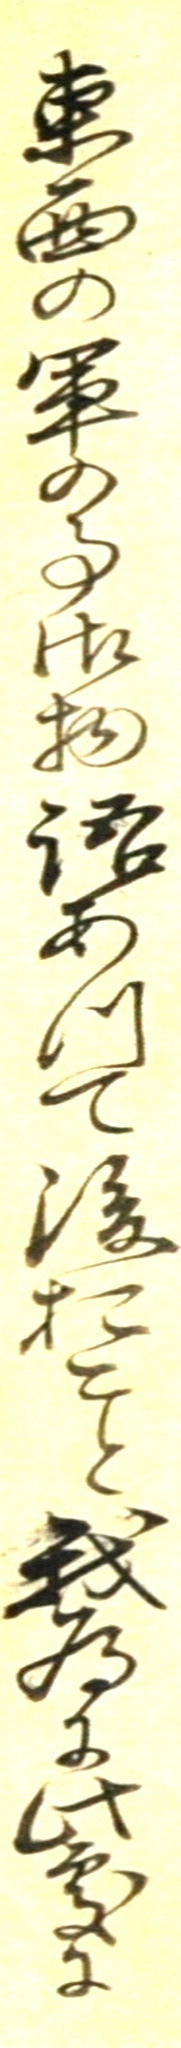東西の軍の事御物語あつて後おこと我為に此処に

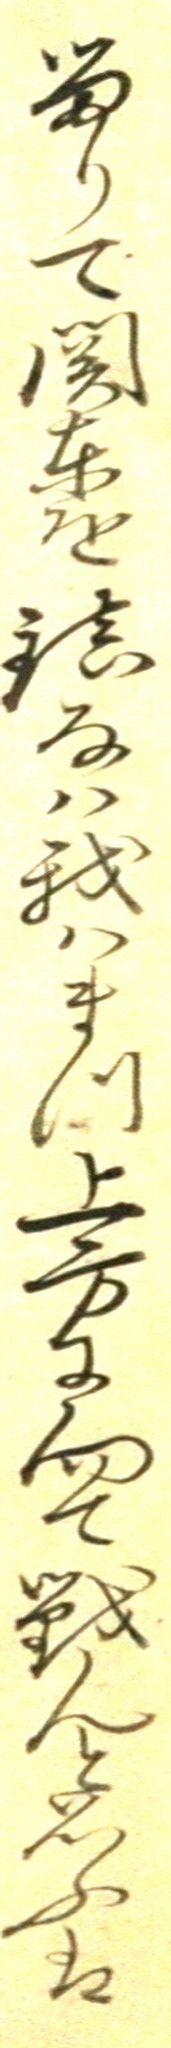留りて関東を鎮なは我はまつ上方に向て戦んと思ふは
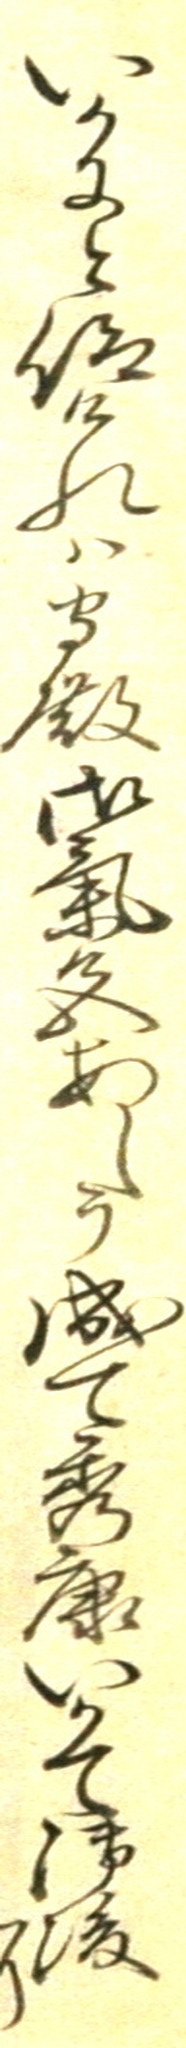いかにと仰けれは守殿御気色あしう成て秀康いかて御後に
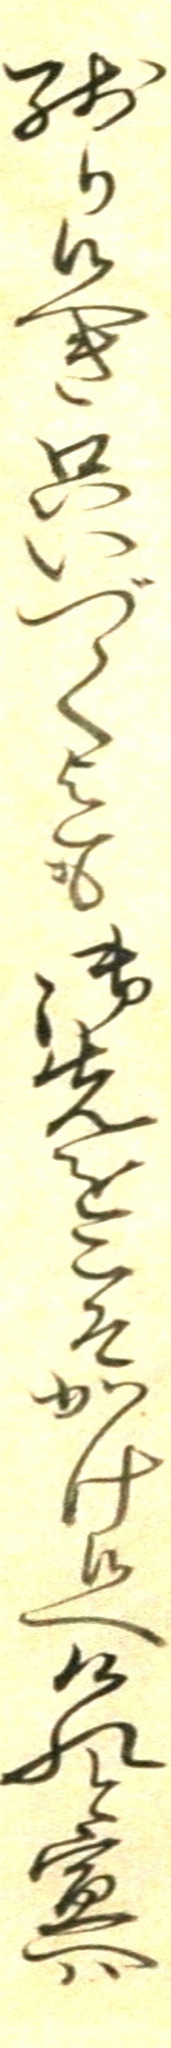残り候へき只いづく迄も御先をこそかけ候へけれと宣へは
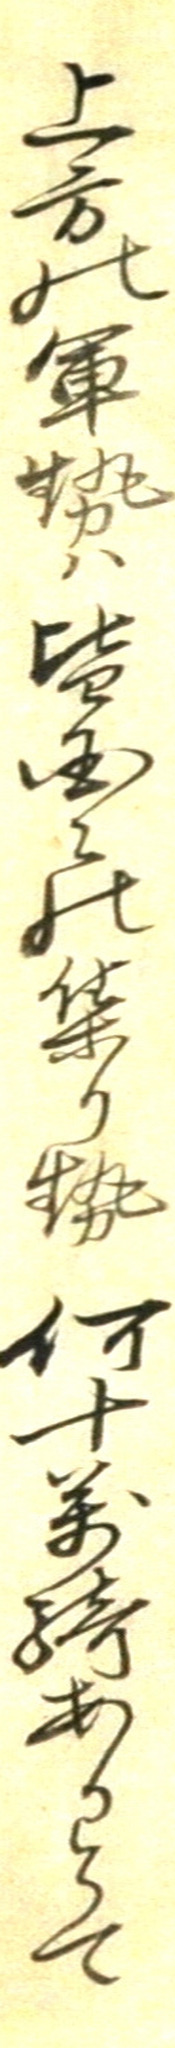上方の軍勢は皆国々の集り勢何十万騎ありとて
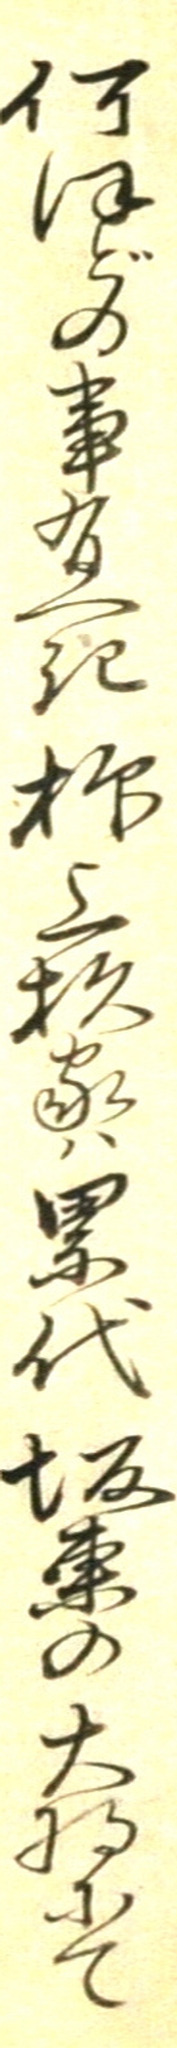何ほどの事有へき抑上杉家は累代坂東の大将にて
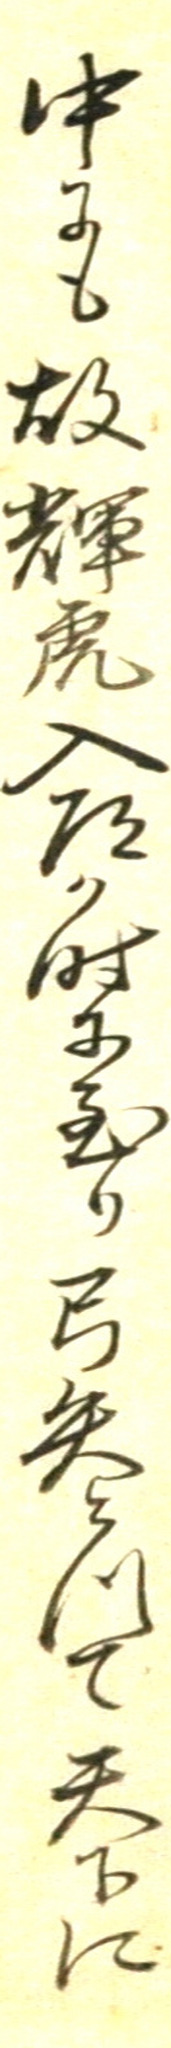中にも故輝虎入道か時に至り弓矢とつて天下に
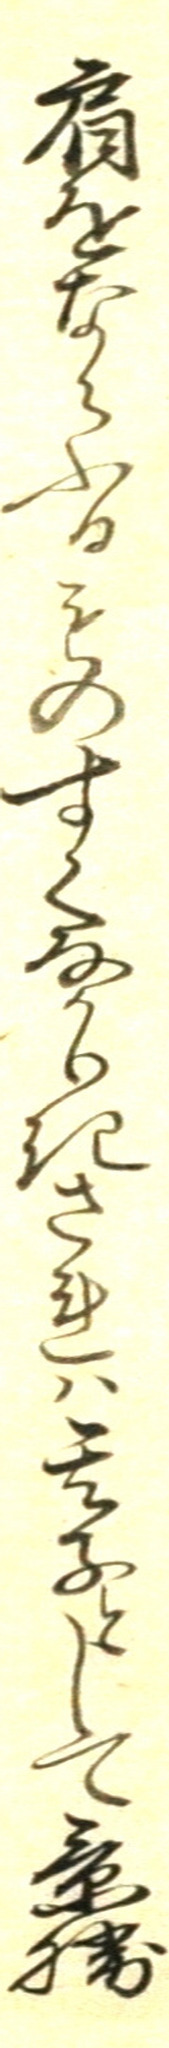肩をならふるものすくなかりきされは其子として景勝
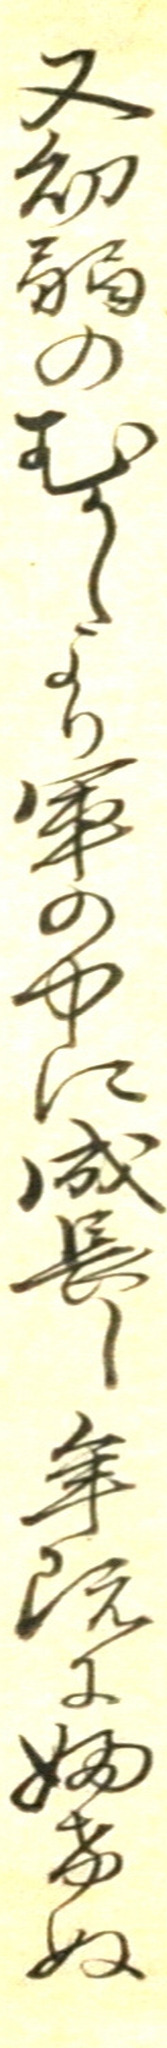又幼弱のむかしより軍の中に成長し年既にふけぬ
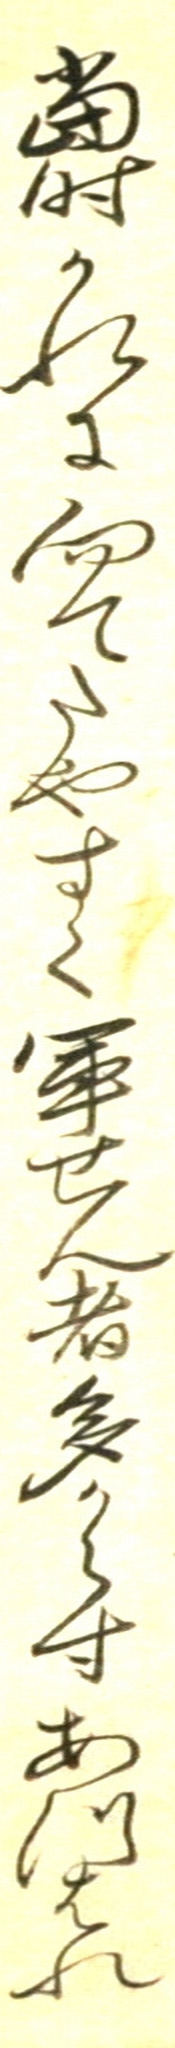当時かれに向てたやすく軍せん者多からすあつはれ
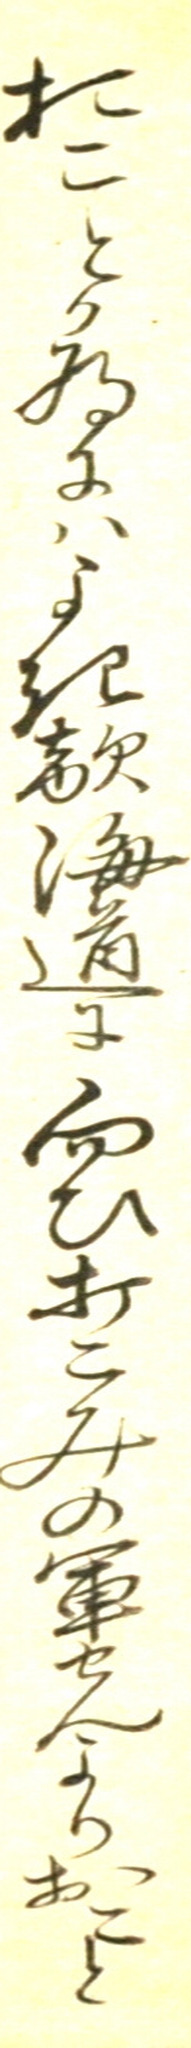おことか為にはよき敵海道に向ひ打こみの軍せんよりおこと
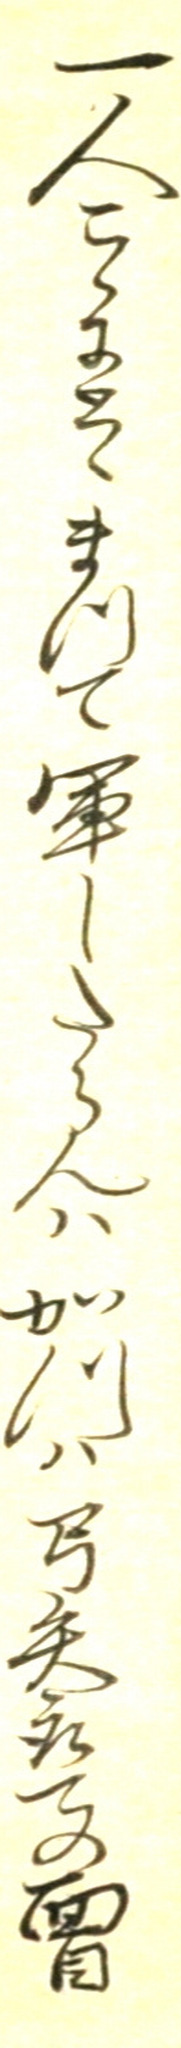一人こゝにとゝまつて軍したらんはかつは弓矢取ての面目
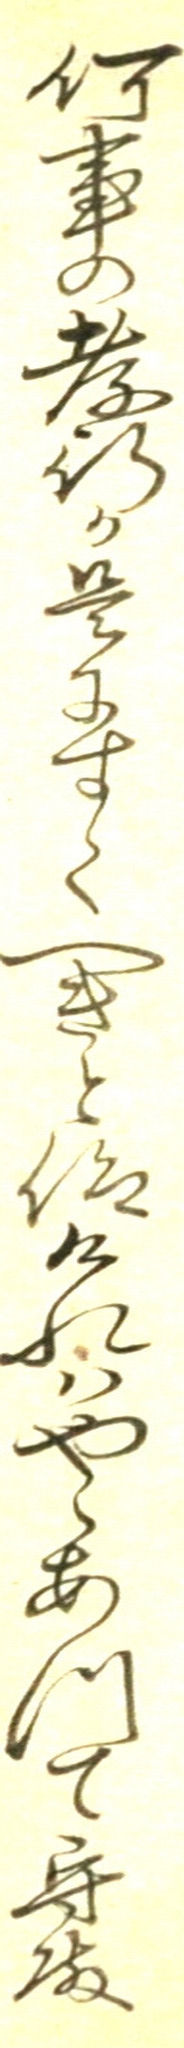何事の孝行か是にすくへきと仰けれはやゝあつて守殿
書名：藩翰譜（一）
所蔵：伊那市立高遠町図書館・合同会社AMANE
